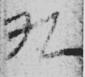九
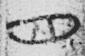四
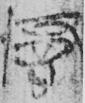誫（臀）
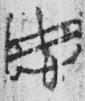○（悔）
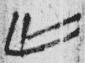亡（无）
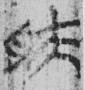肤
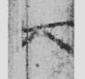亓
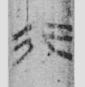行
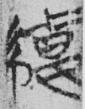緀
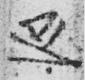疋（且）
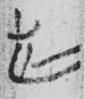○（喪）
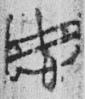○（悔）
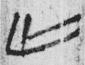亡（无）
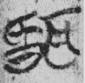䎽（聞）
